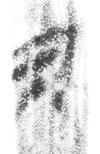行
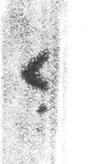㠯（以）
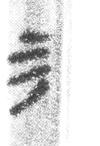天
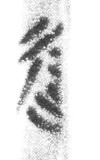道
